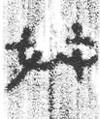戔
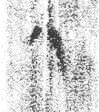人
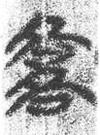○（格）
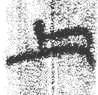上
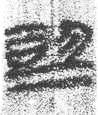則（則）
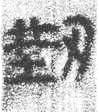型（刑）
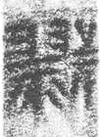戮
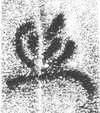至
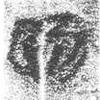剛
